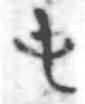屯
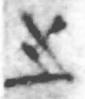之
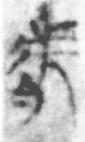○（虎）
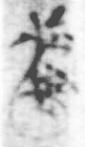○（韔）
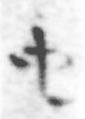屯
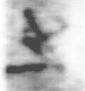之
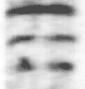三
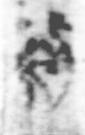紫
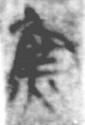魚
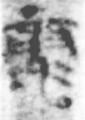彔（綠）
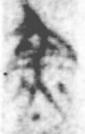魚
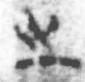之
